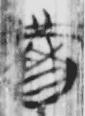○（許）
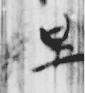○（盈）
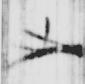之
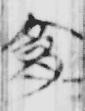亯
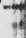月
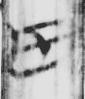甲
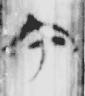午
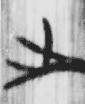之
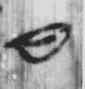日
